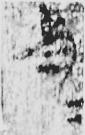十月
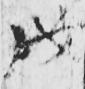戊
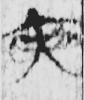寅
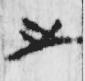之
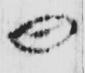日
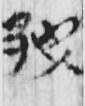○（鄢）
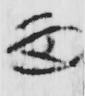正
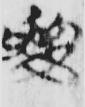婁
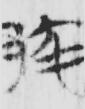蔡
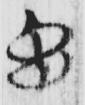玄
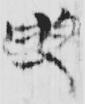受
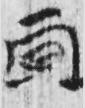○（期）
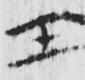壬
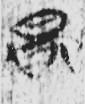晨
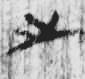之
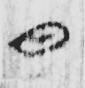日
